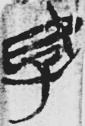好
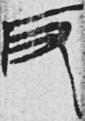反
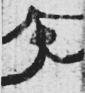內
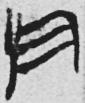於
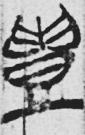豊（禮）
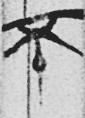不
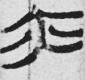亦
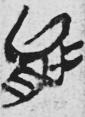能
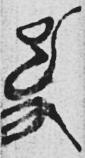改
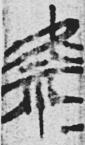{虍示}（乎）
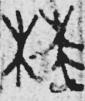梂（樛）
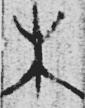木
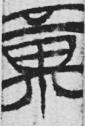福
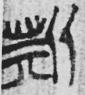斯
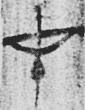才（在）
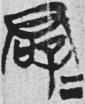子君
